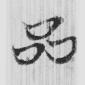厽
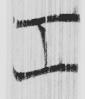工
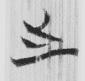之
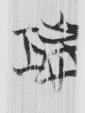{工者}
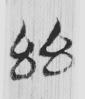𢆶
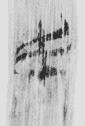民
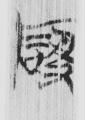{石刀又}
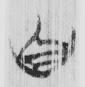自
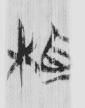相
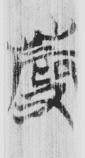蓐
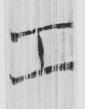工
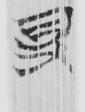𠭁
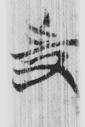寺
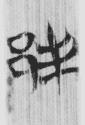邦
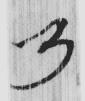乃
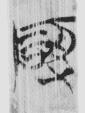{石刀又}
